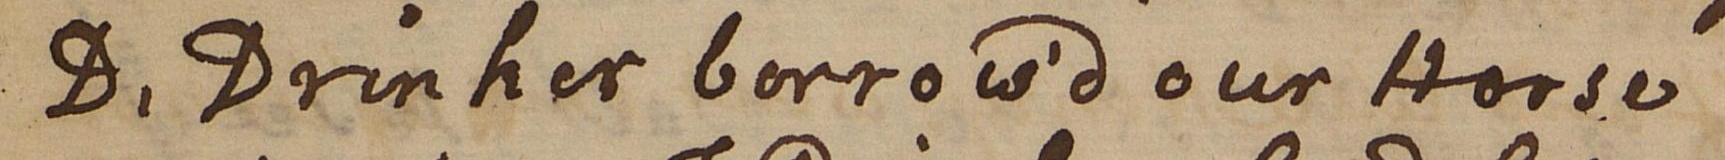D. Drinker borrow'd our Horse
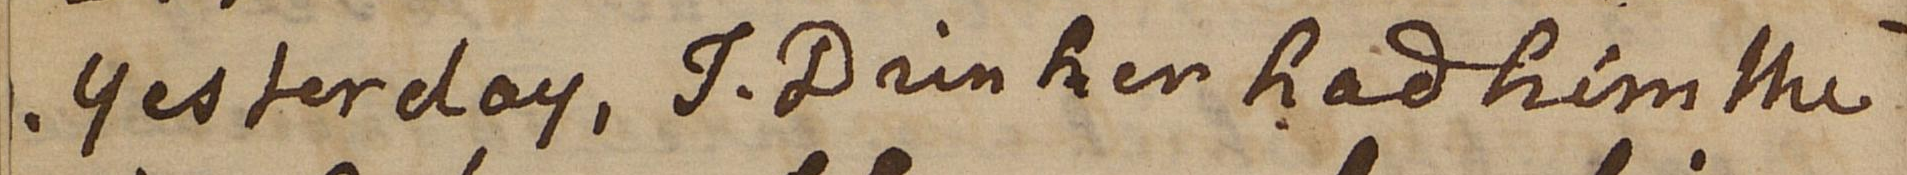yesterday, J. Drinker had him the
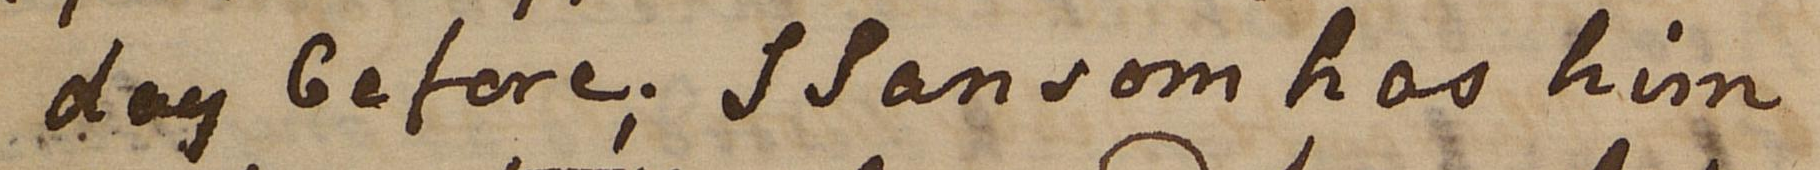day before. S Sansom has him
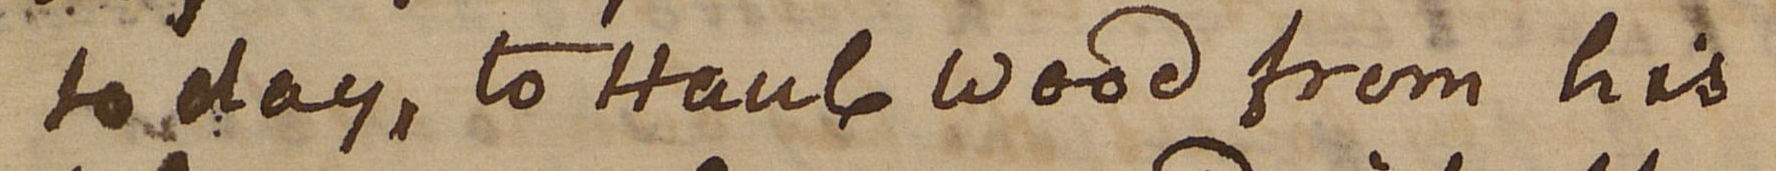to day, to Haul Wood from his
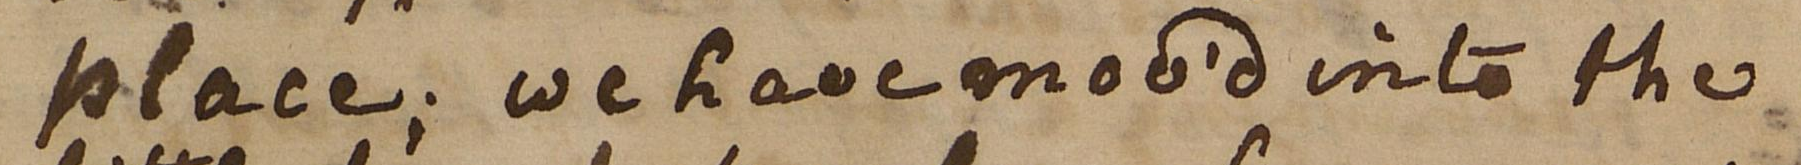place; we have mov'd into the
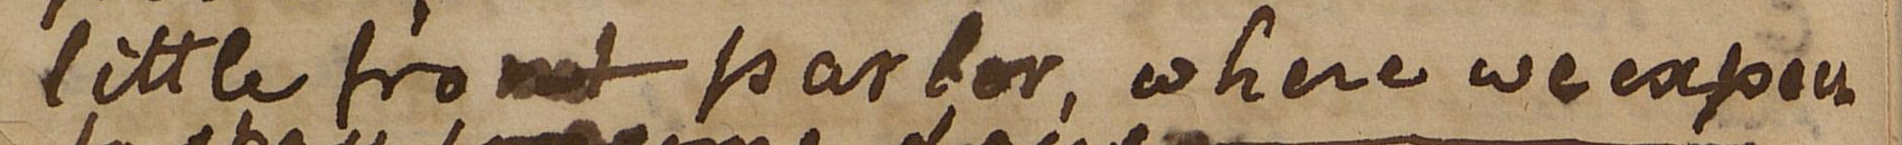little front parlor, where we expres
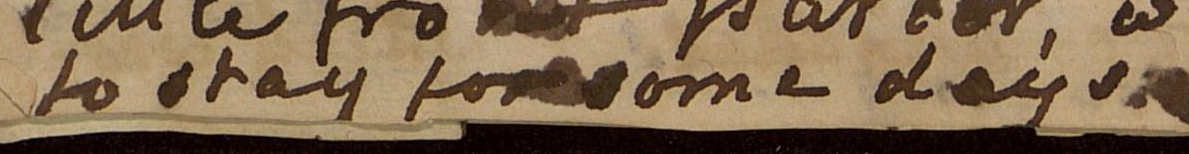to stay for some days
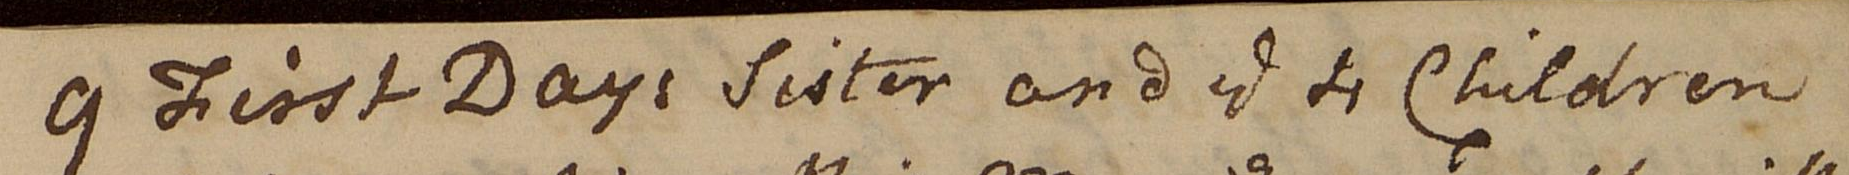9 First Days Sister and y^e 4 Children
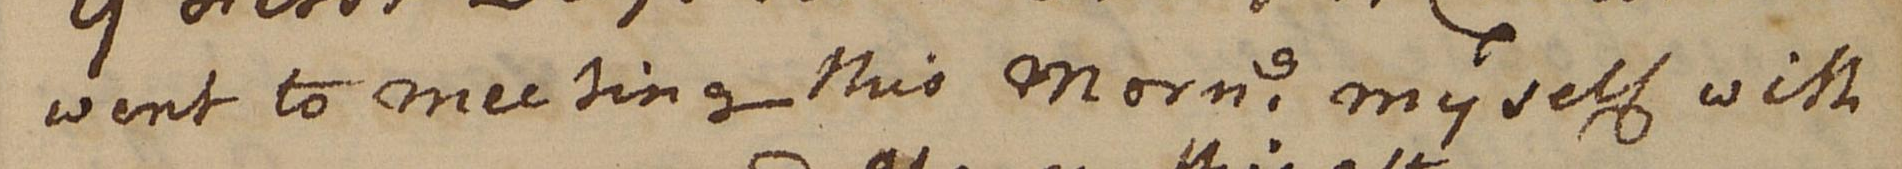went to meeting this Morn^g. myself, with
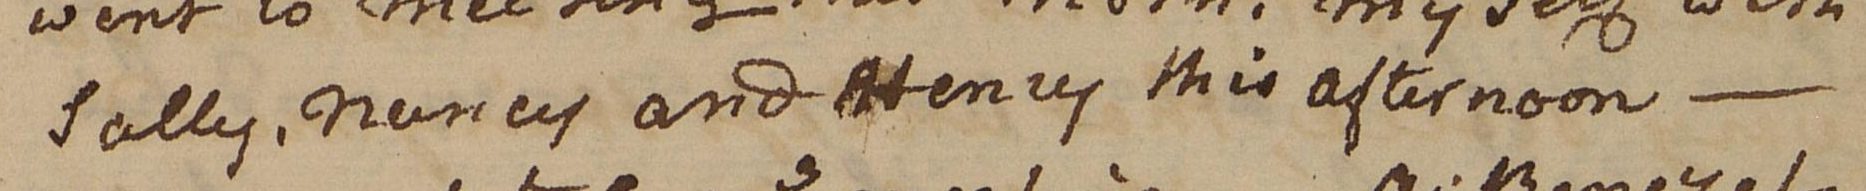Sally, Nancy and Henry this Afternoon-
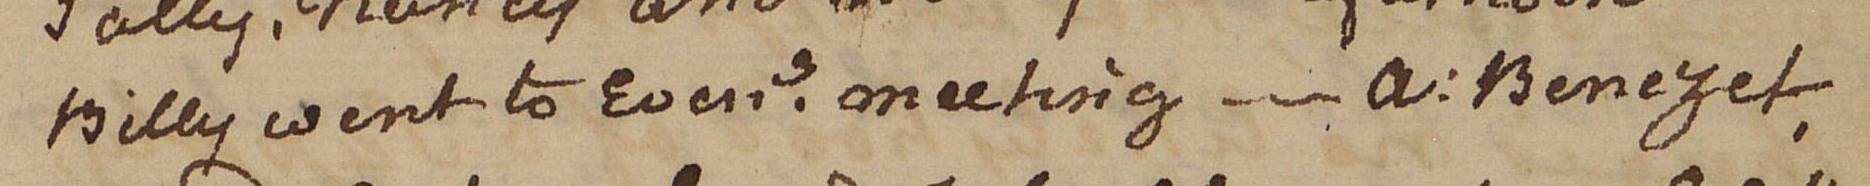Billy went to Even^g. meeting- A: Benezet,
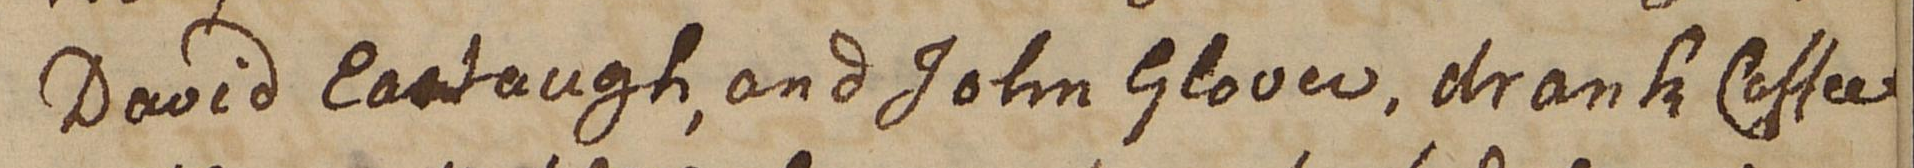David Eastaugh, and John Glover, drank Coffee
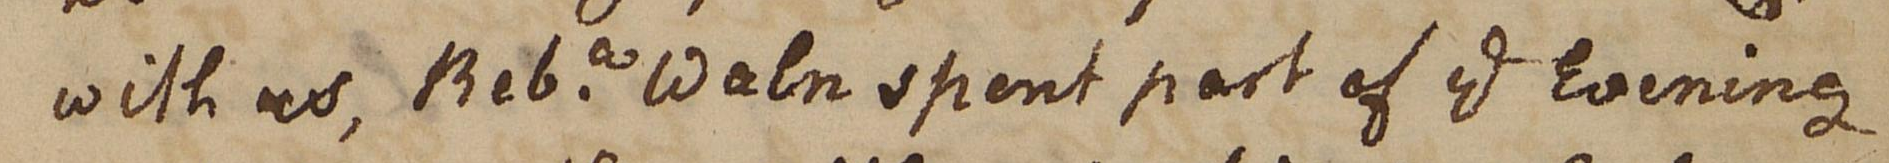with us, Reb^a. Waln spent part of y^e Evening
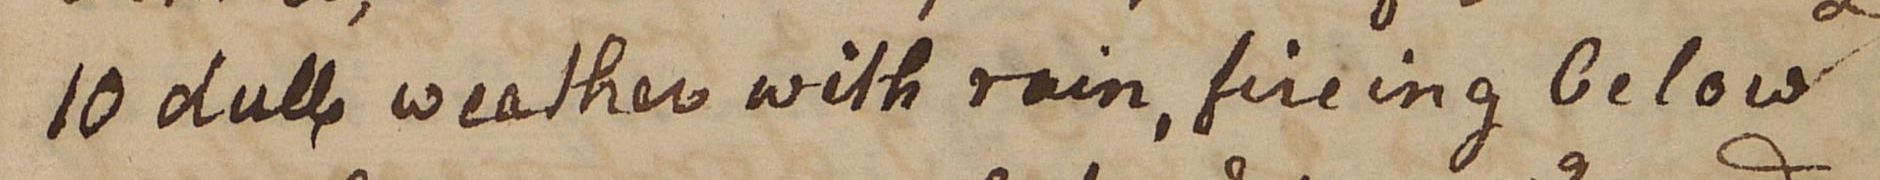10 dull weather with rain, fireing below
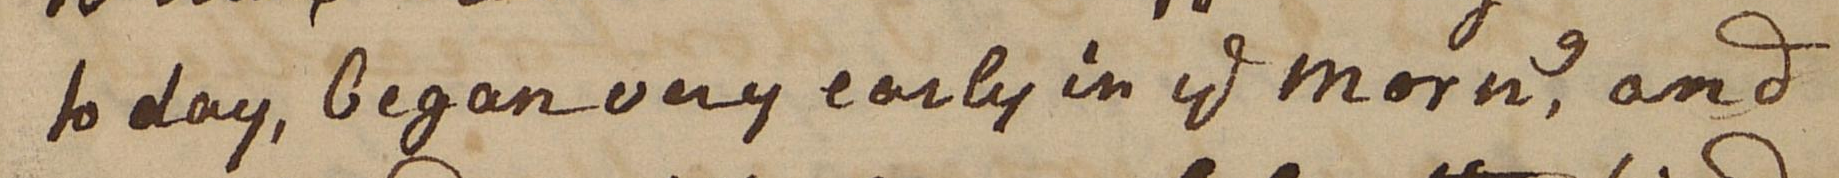to day, began very early in y^e morn^g, and
